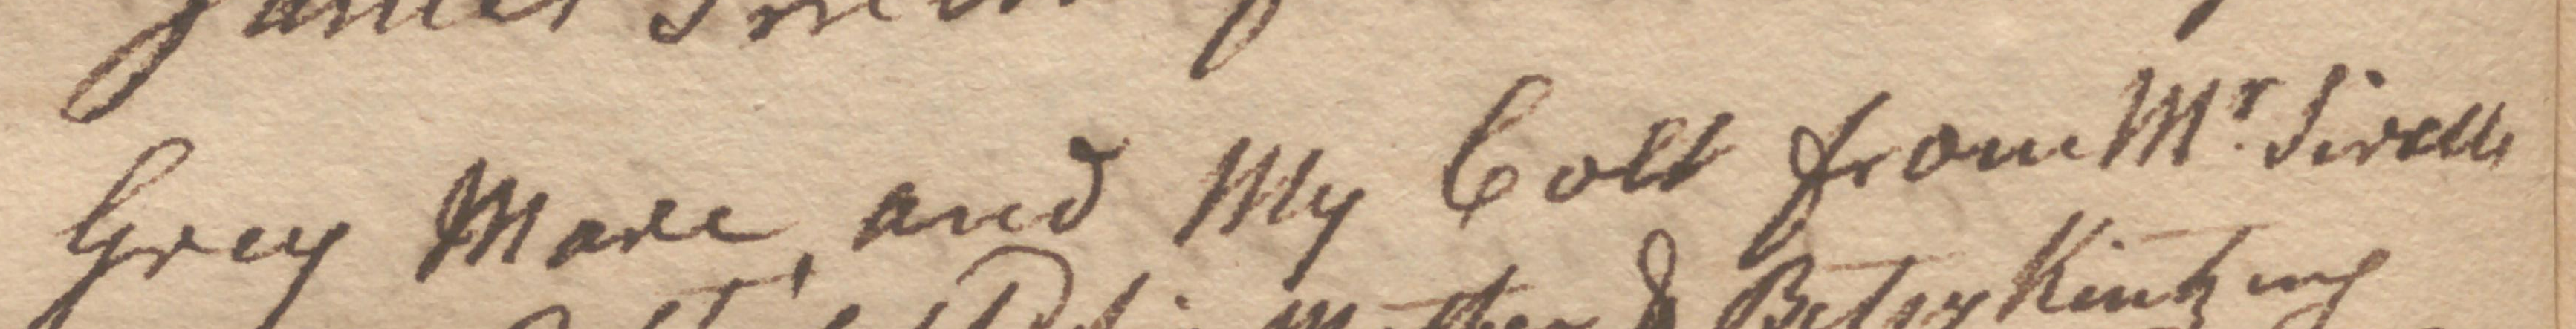Grey Mare, and My Colt from M^r Sirells
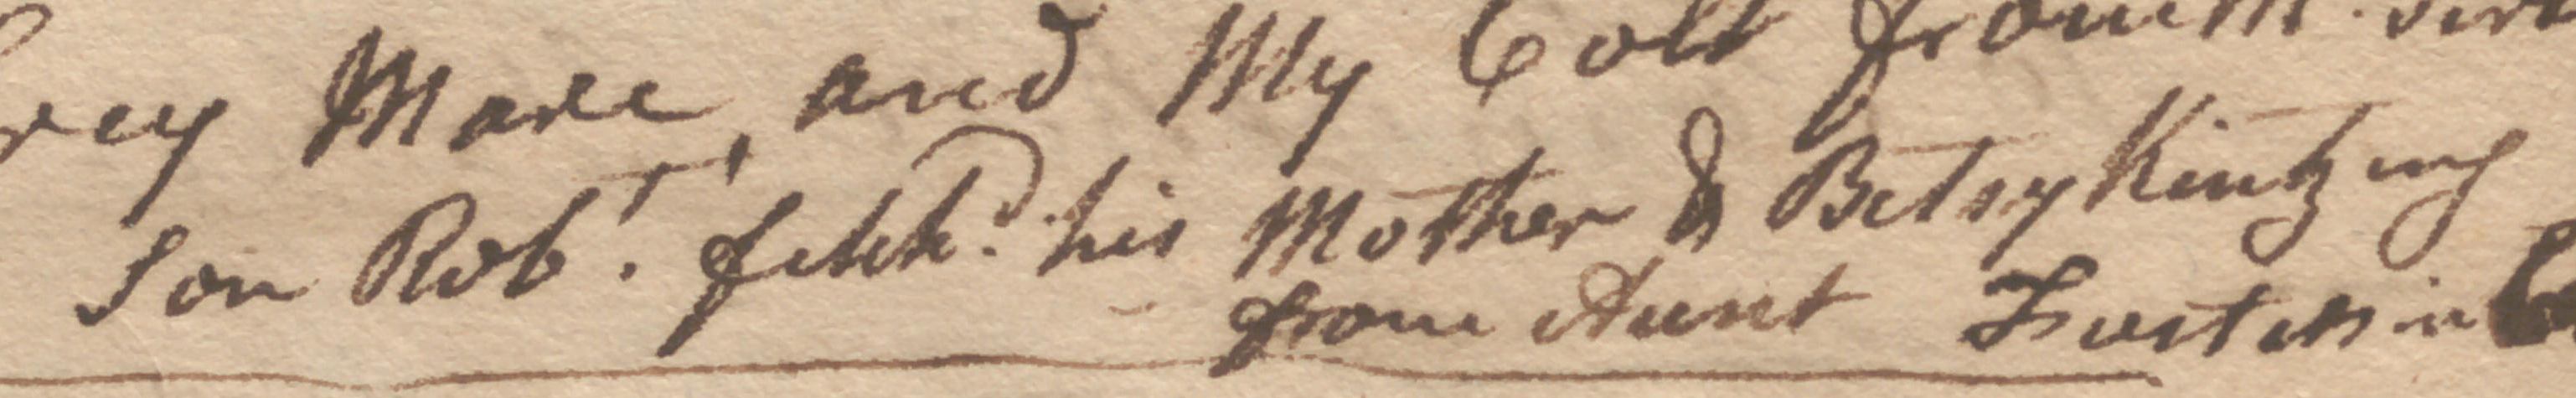Son Rob^t. fetch^d. his Mother & Betsy Kintzing
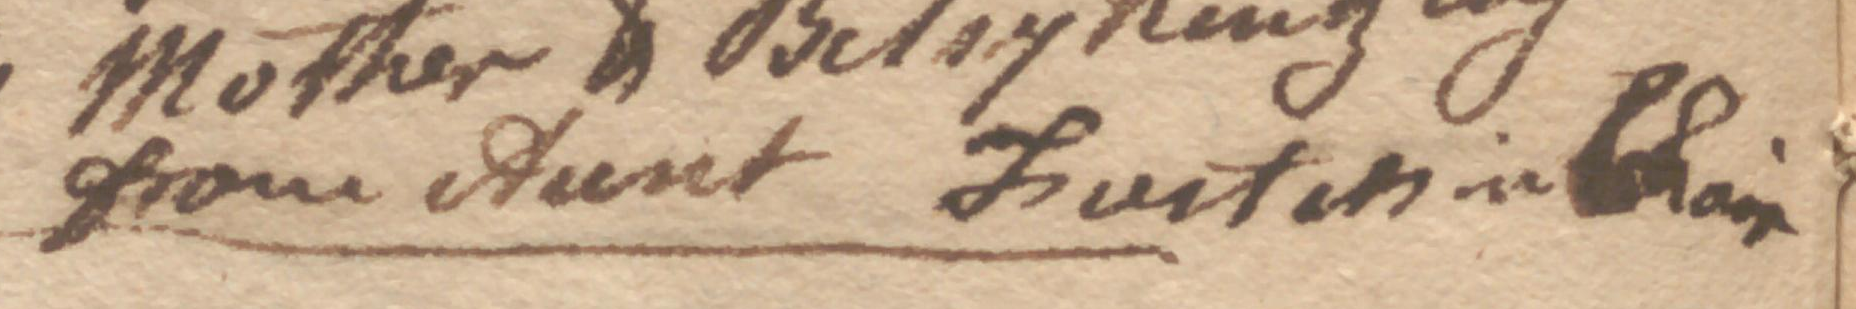fron Aunt Fosters in Chair
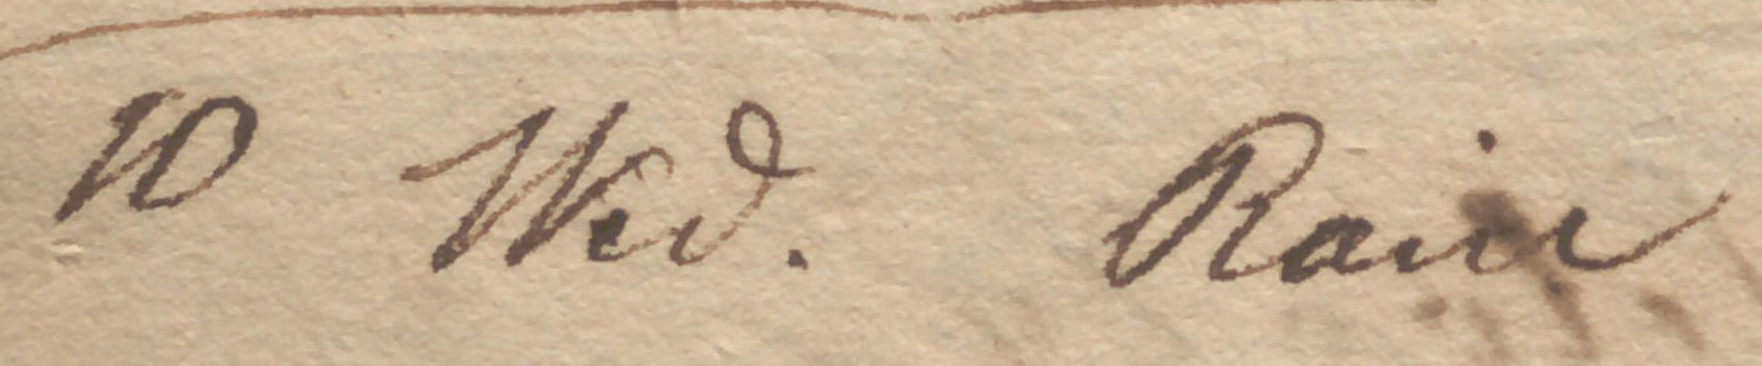10 Wed. Rain
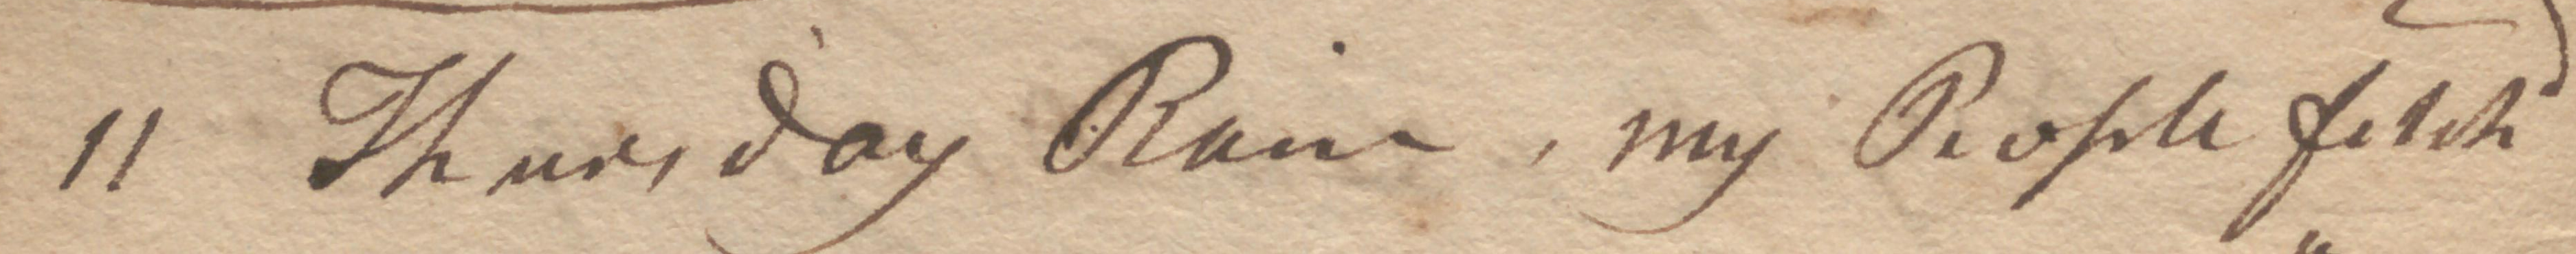11 Thursday Rain, my People fetch
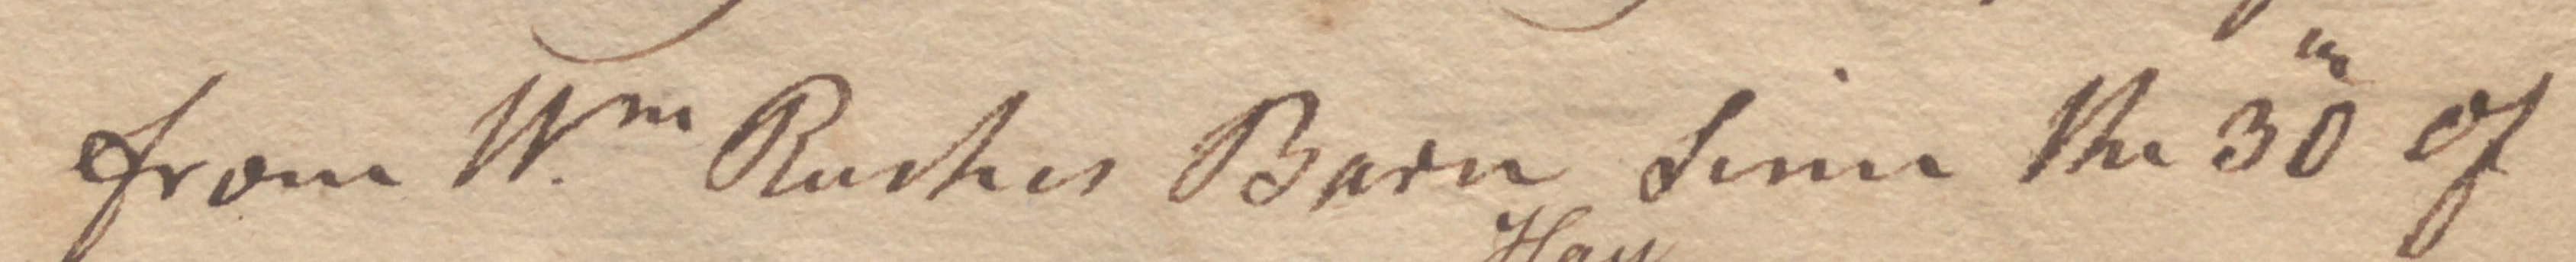from W^m. Rushes Barn since the 30^th of
